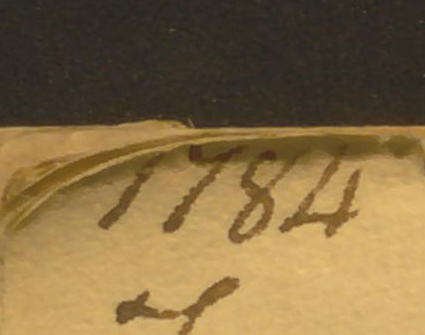1784
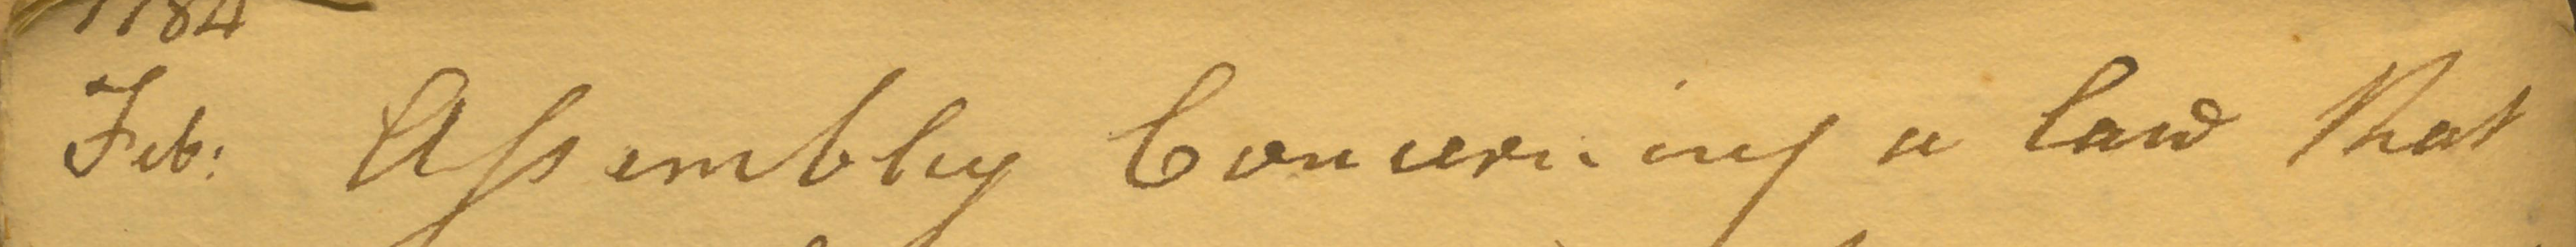Feb. Assembley Concerning a law that
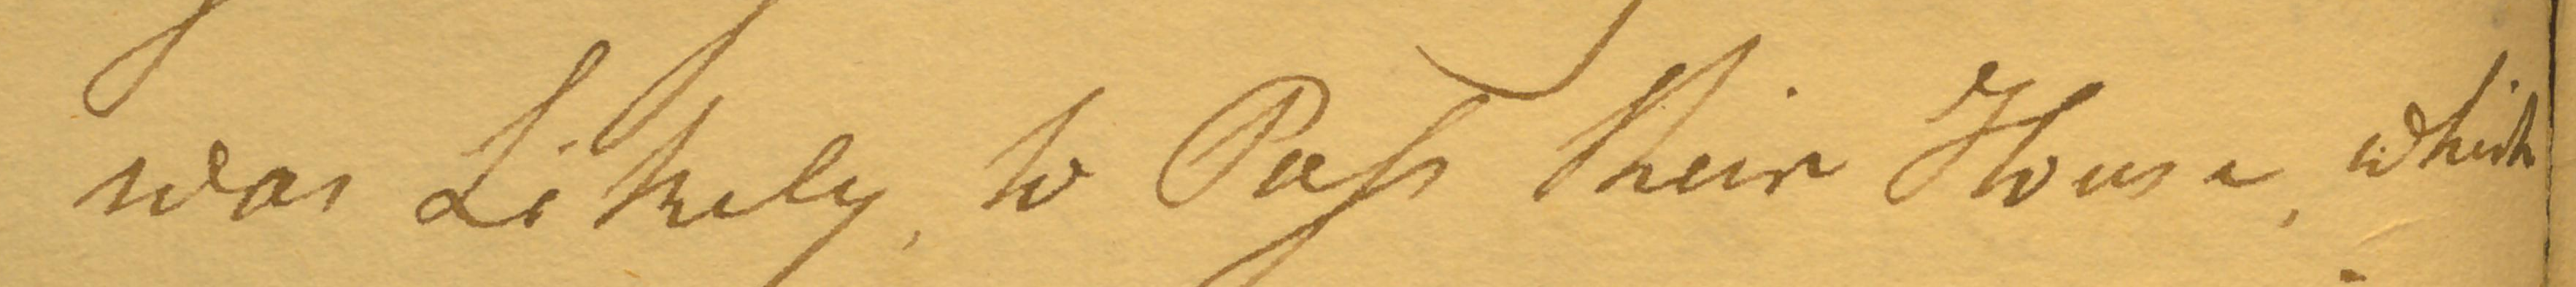was Likely to Pess their House which
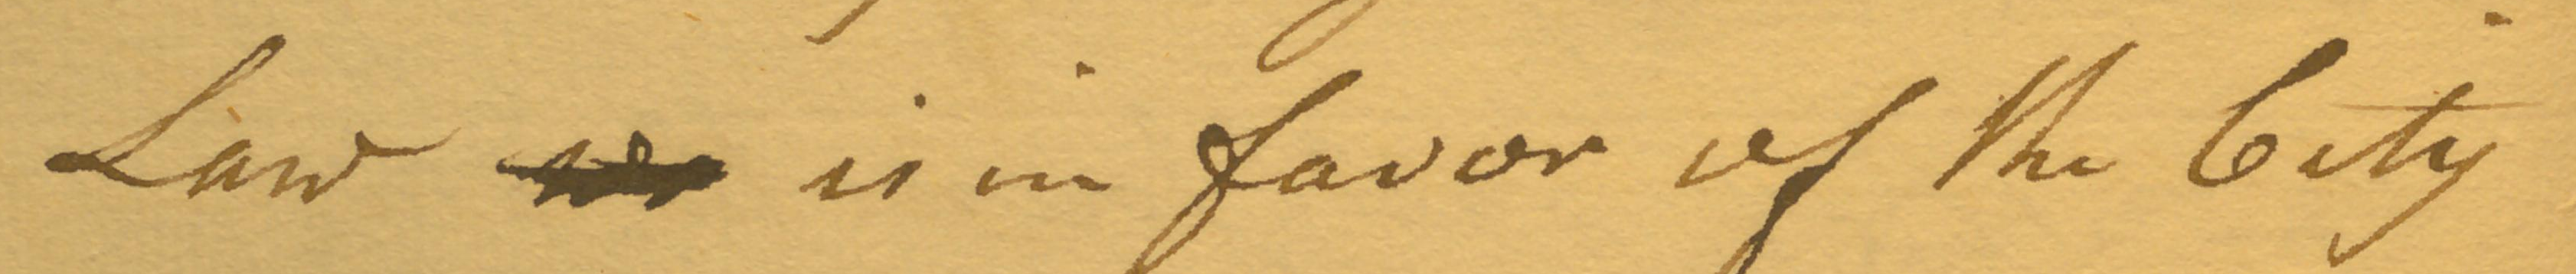Law [we] is in favor of the City
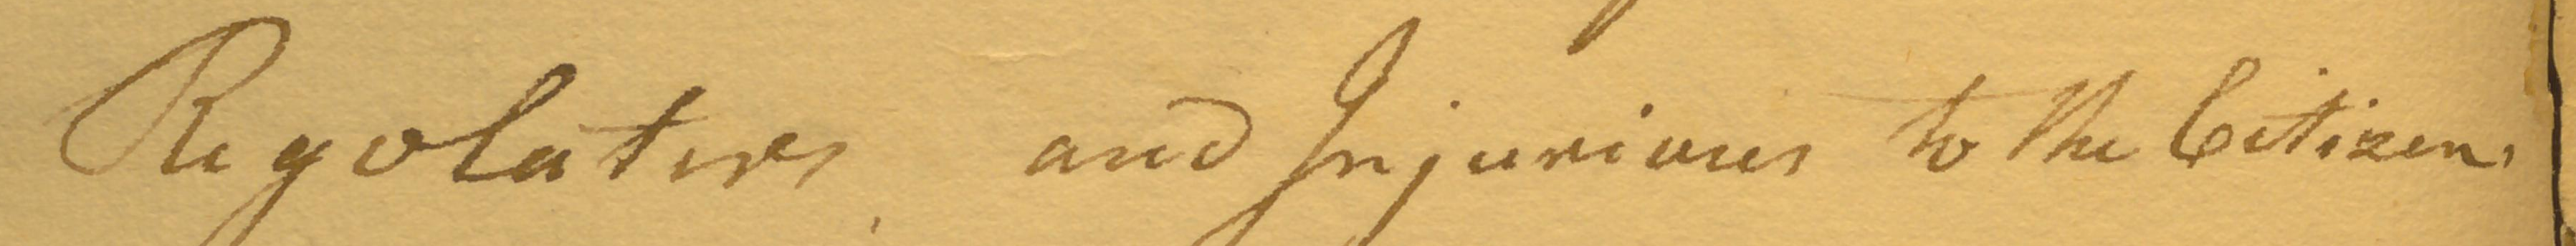Regolaters and Injurious to the Citizens
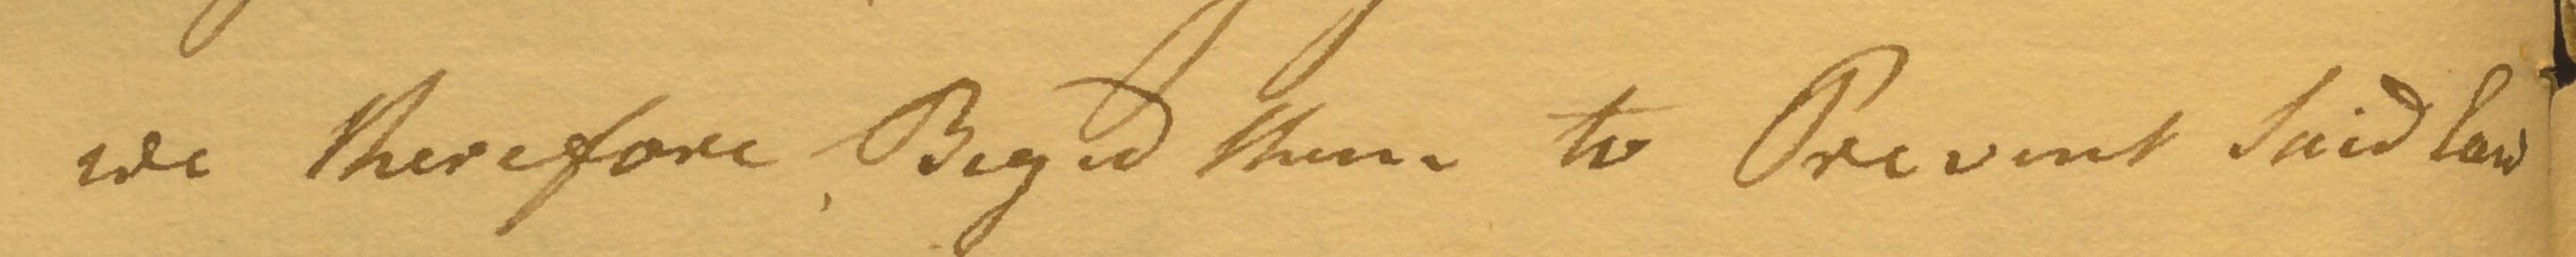we therefore Beged them to Prevent Said law
